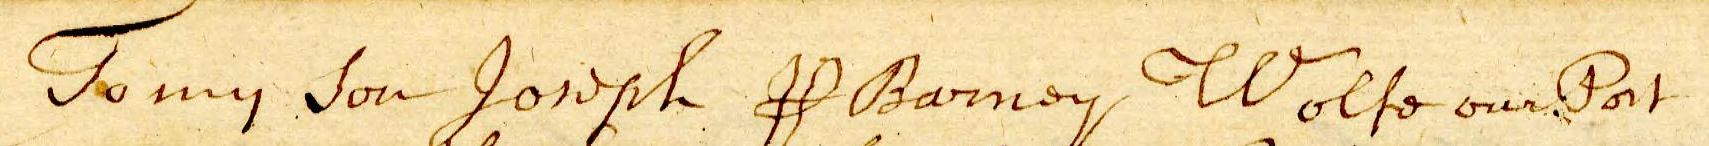To my Son Joseph & Barney Wolfe our Post
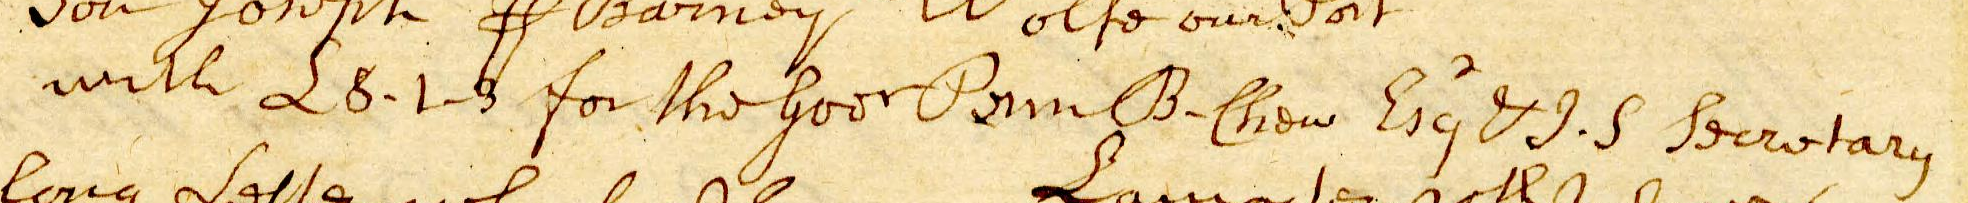with £8.1.3 for the Govr Penn B. Chew Esq^r & J.S Secretary
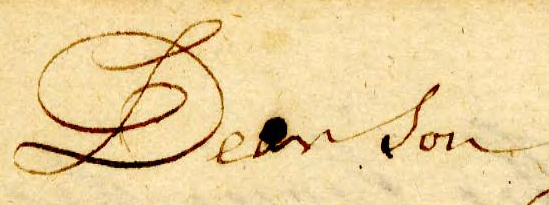Dear Son
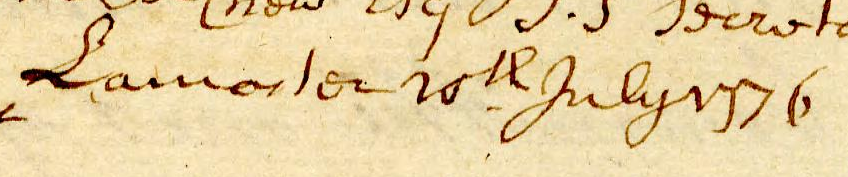Lancaster 20^th July 1776
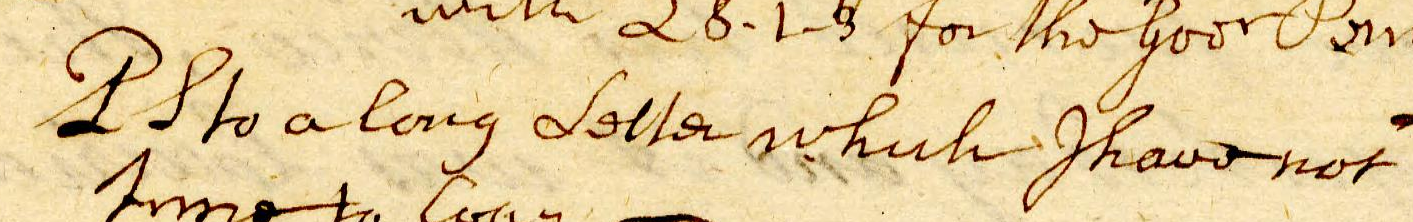PS to a long Letter which I have not
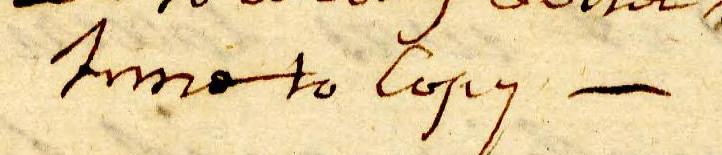Time to Copy-
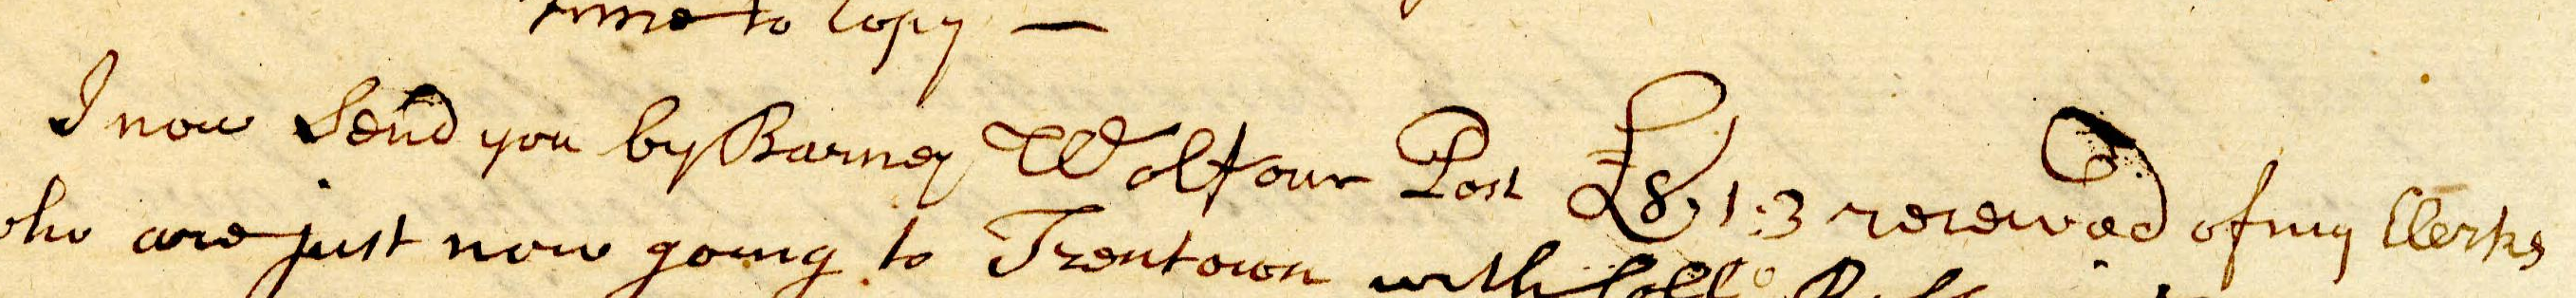I now Send you by Barney Wolf our Post £8.1..3 received of my Clerks
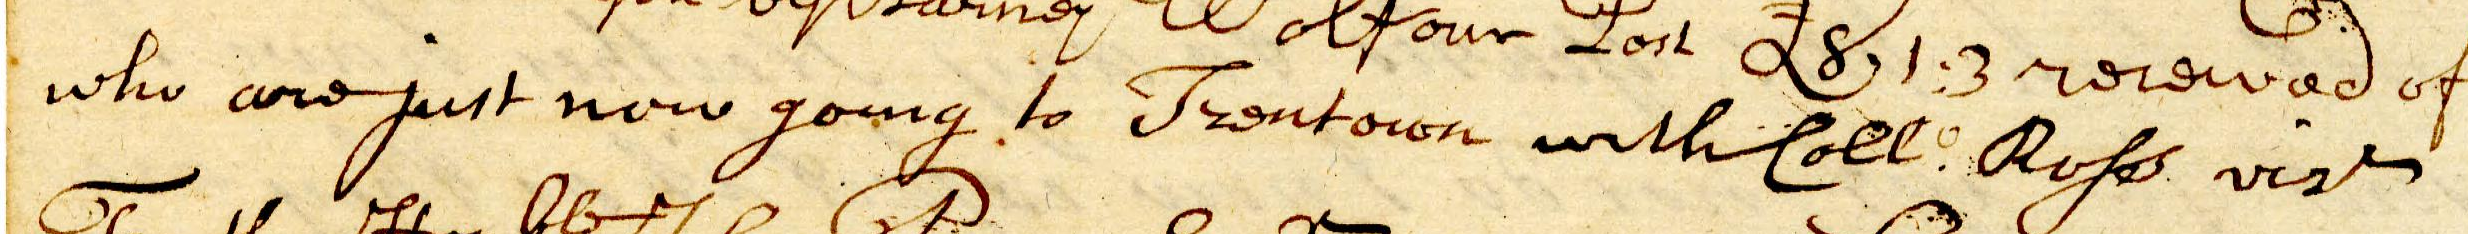who are just now going to Trentown with Coll^o. Ross vis^t
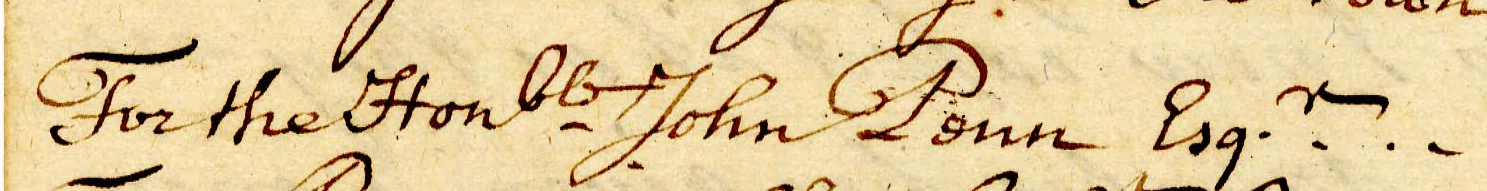For the Hon^ble- John Penn Esq.^r...
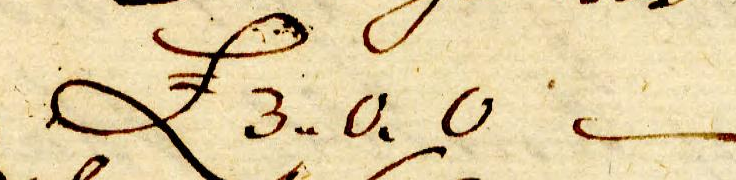£3..0.0-
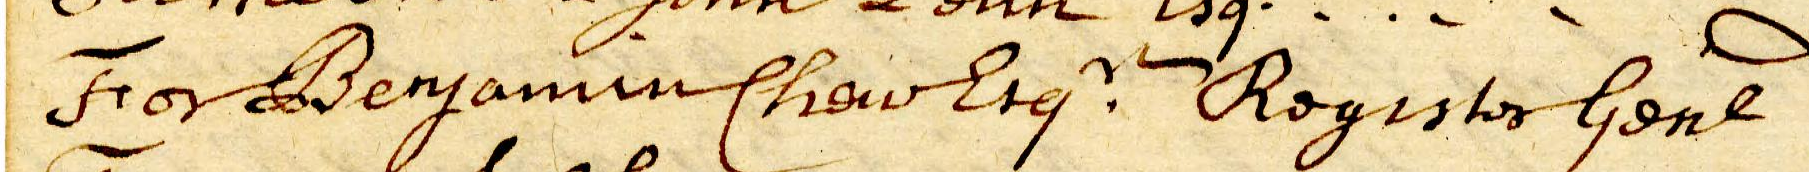For Benjamin Chew Esq^r. Register Gen^l
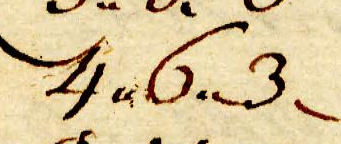4..6..3
